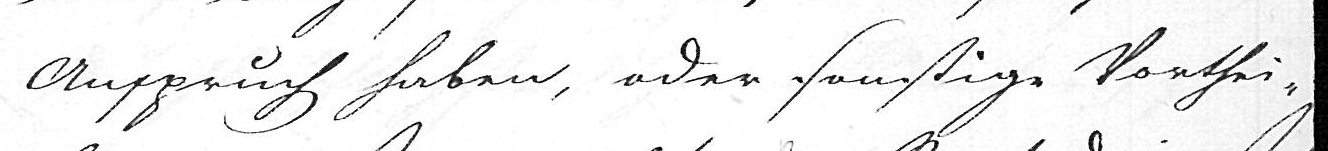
Anspruch haben, oder sonstige Vorthei-
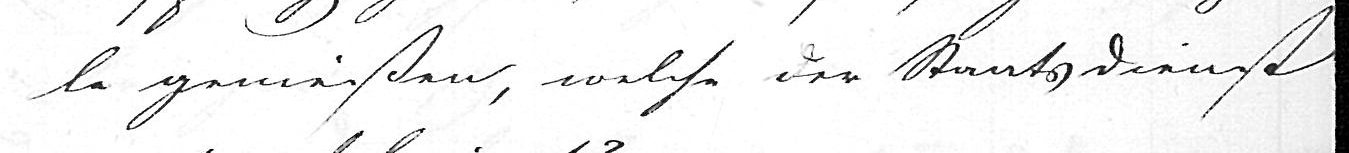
le genießen, welche der Staatsdienst
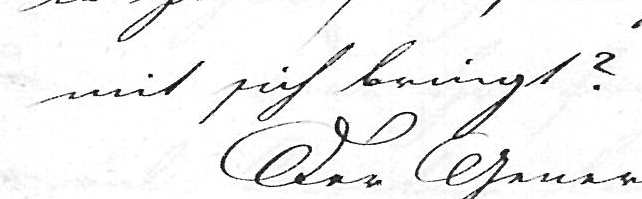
mit sich bringt?
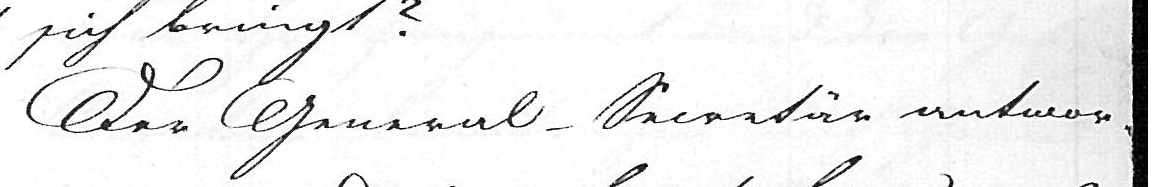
Der General-Secretär antwor-
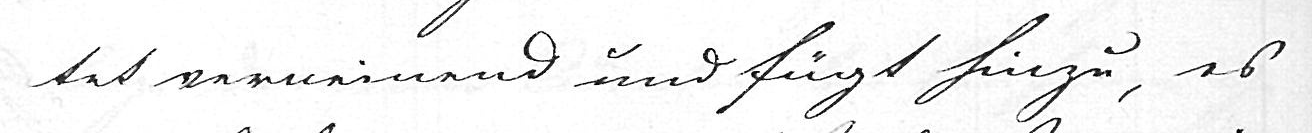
tet verneinend und fügt hinzu, es
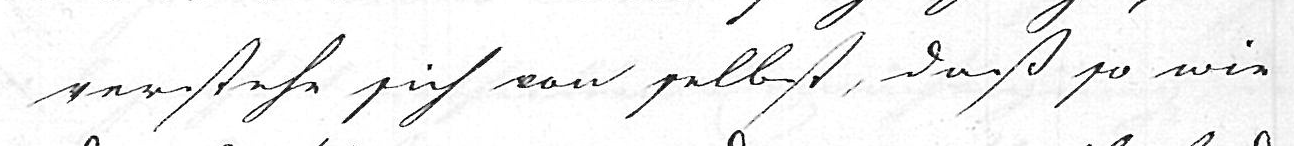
verstehe sich von selbst, daß so wie
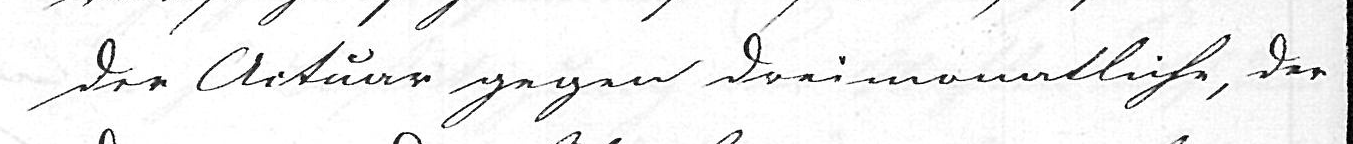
der Actuar gegen dreimonatliche, der
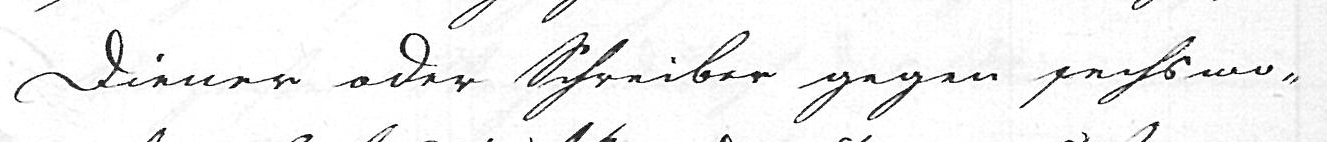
Diener oder Schreiben gegen sechswo-
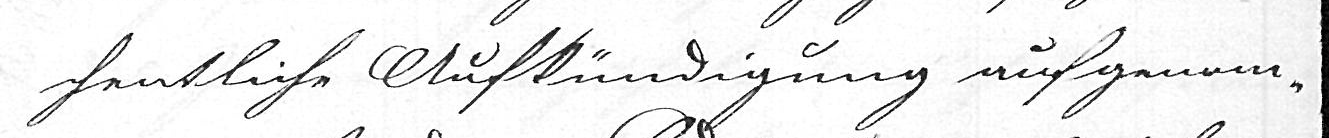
chentliche Aufkündigung aufgenom-
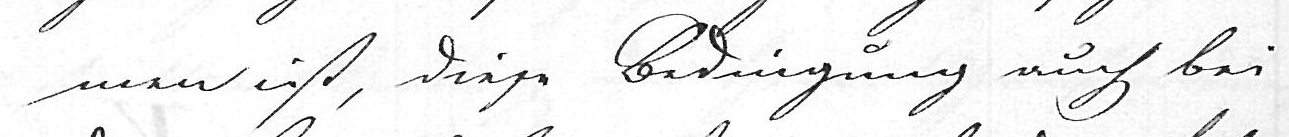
men ist, diese Bedingung auch bei
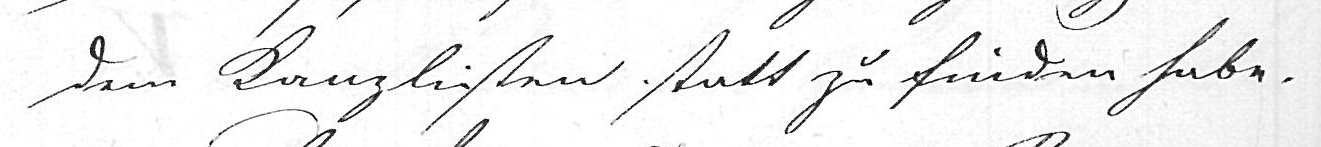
dem Kanzlisten statt zu finden habe.
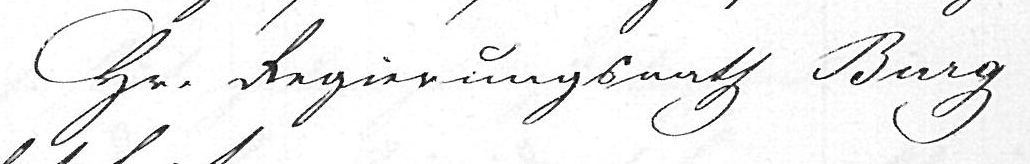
Hr. Regierungsrath Burg
